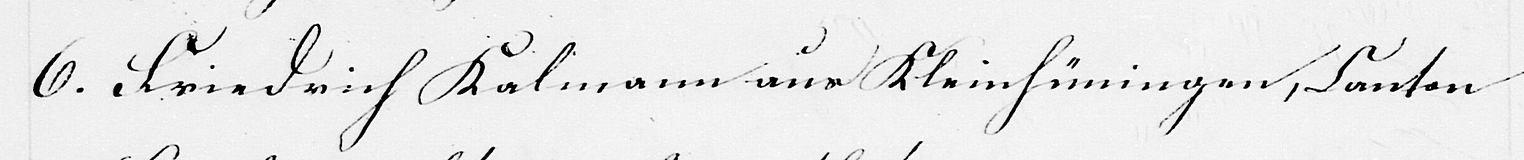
6. Friedrich Kalmann aus Kleinhüningen, Canton
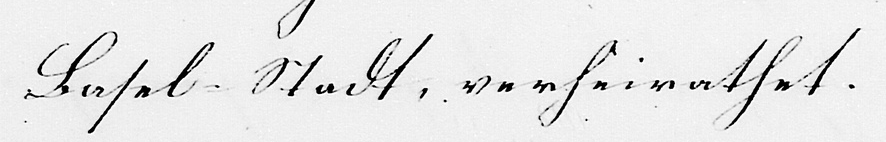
Basel-Stadt, verheirathet.
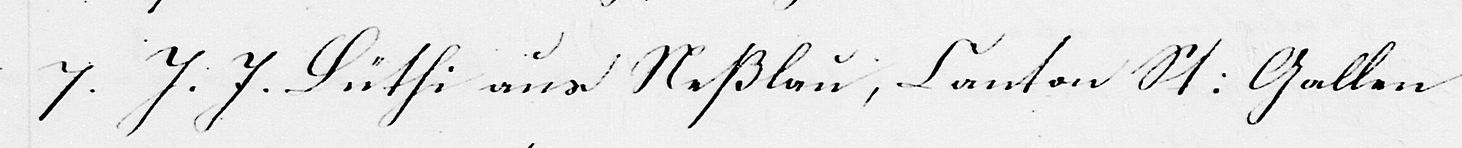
7. J. J. Lüthi aus Neßlau, Canton St: Gallen
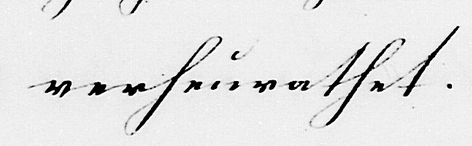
verheurathet.
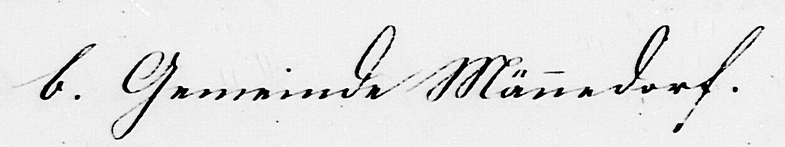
b. Gemeinde Männedorf.
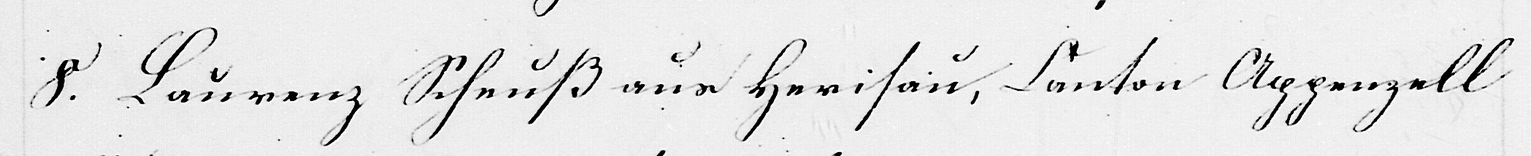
8. Laurenz Schnuß aus Herisau, Canton Appenzell
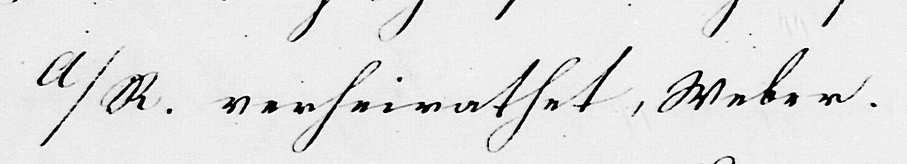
A/R. verheirathet, Weber.
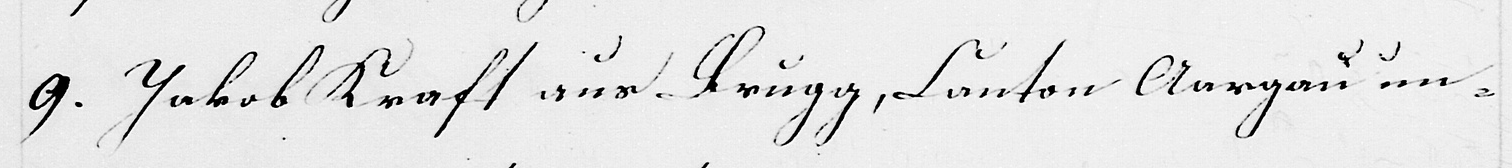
9. Jakob Kraft aus Brugg, Canton Aargau un¬
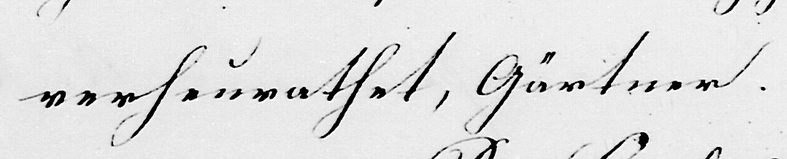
verheurathet, Gärtner.
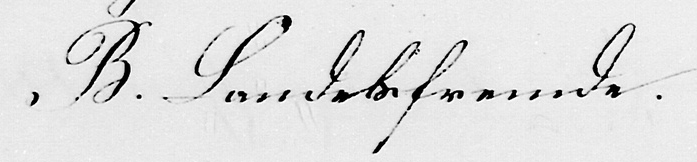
B. Landelsfremde.
